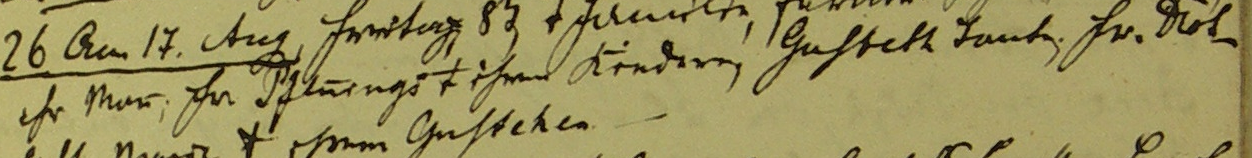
Fr. Pfenniges mit ihren Kindern, Gusbeth ?Lante. Fr. Drotl-
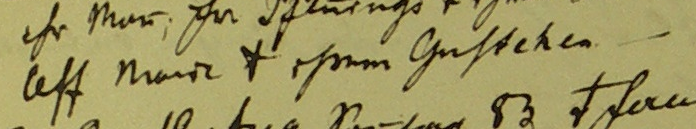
eff ?Manz mit ihrem Gustchen.—
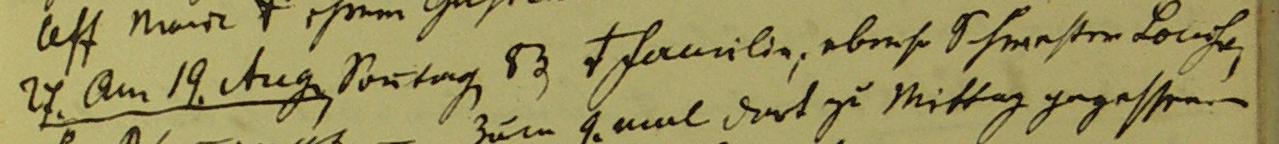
27) Am 19. Aug. 83. Sonntag, mit Familie, ebenso Schwester Louise,
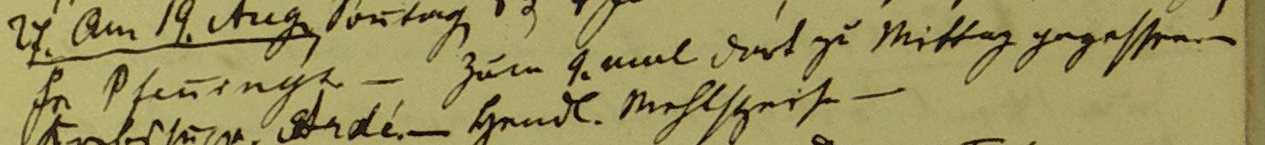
Fr. Pfenniges.—Zum 9. mal dort zu Mittag gegessen.
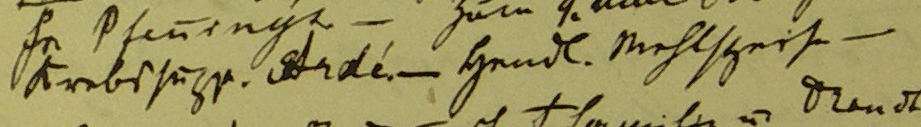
Krebssupe . Arde.- Hendl. Mehlspeise.—
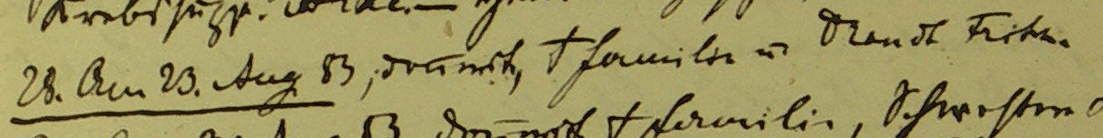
28) Am 23 Aug. 83. Donnerstag, mit Familie und Draudt Fritz.-
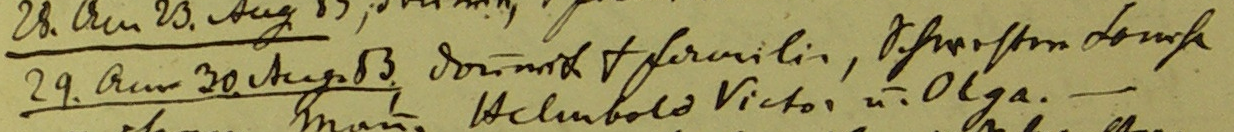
29) Am 30. Aug. 83, Donnerstag mit Familie , Schwester Louise
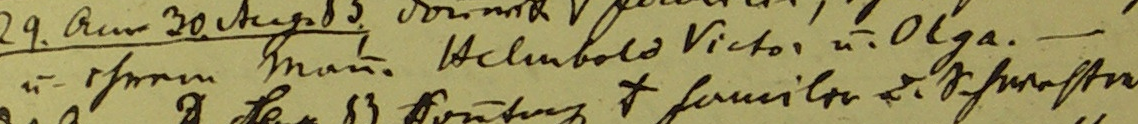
und Ihr mann. Helmbold Victor und Olga.
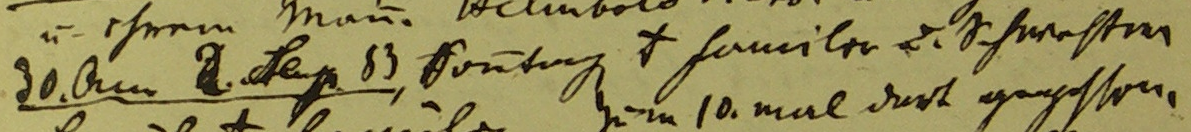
30) Am 3. Sept. 83, Sonntag, mit Familie und Schwester
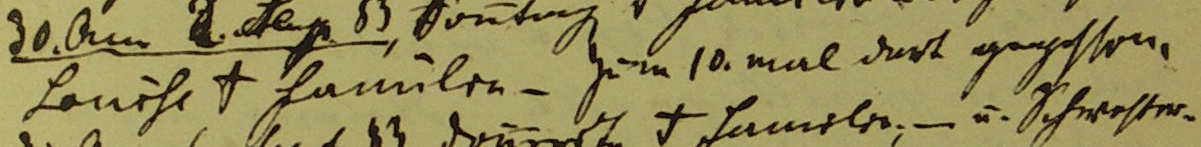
Louise mit Familie.- Zum 10. Mal dort gegessen .Zum 10. mal dort gegessen.
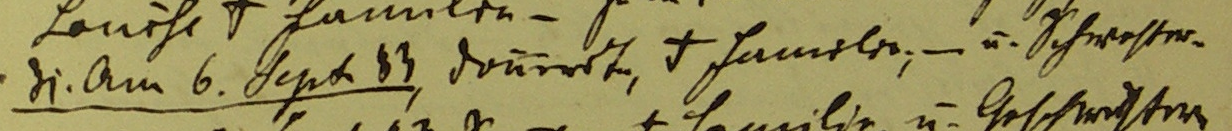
31) Am 6. Sept. 83, Donnerstag, mit Familie,-- und Schwester.
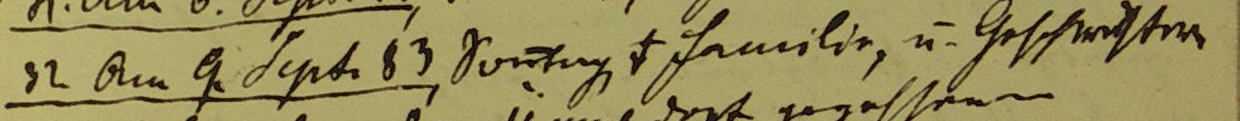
32) Am 9. Sept. 83 , Sonntag, mit Familie, und Geschwister
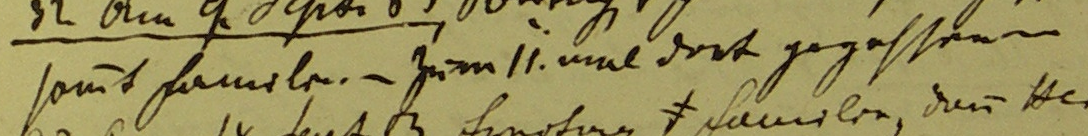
samt Familien.-Zum 11. Mal dort gegessen.
